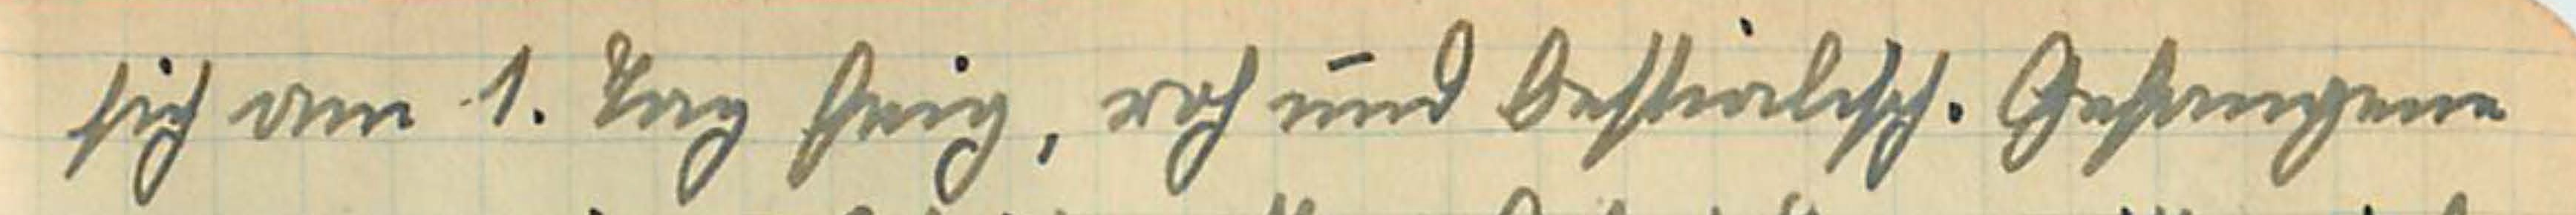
sich am 1. Tag feig, roh und bestialisch. Gefangene
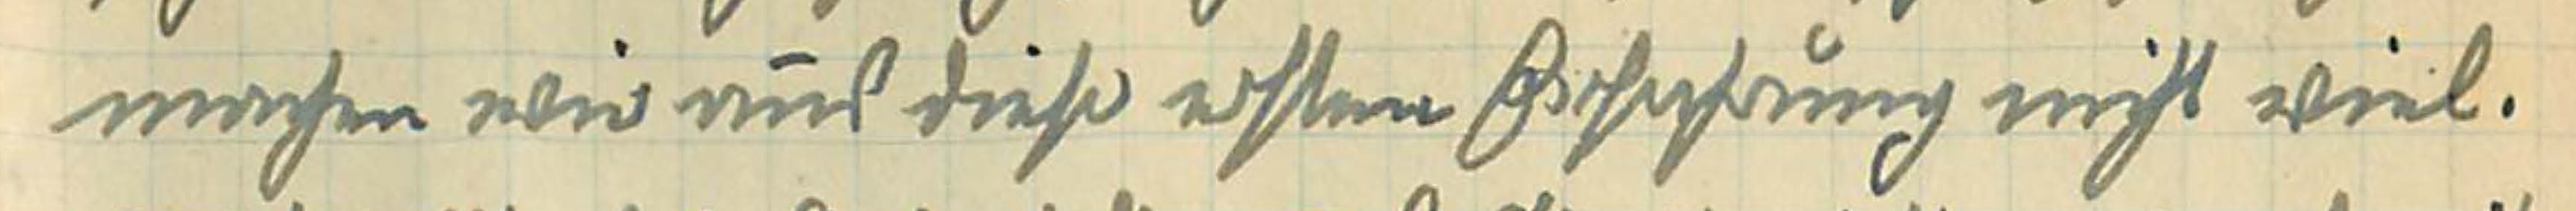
machen wir aus dieser ersten Erfahrung nicht viel.
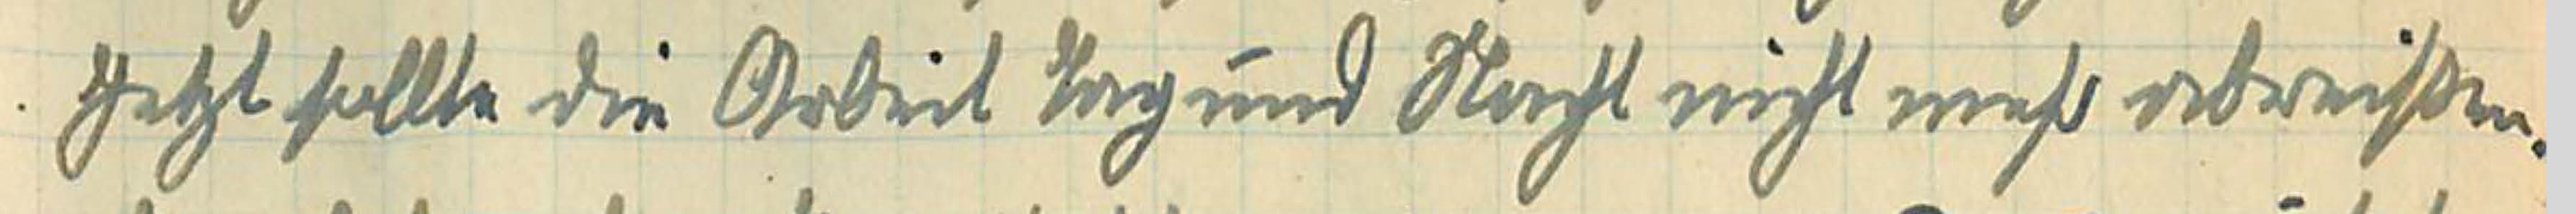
Jetzt sollte die Arbeit Tag und Nacht nicht mehr abreißen.
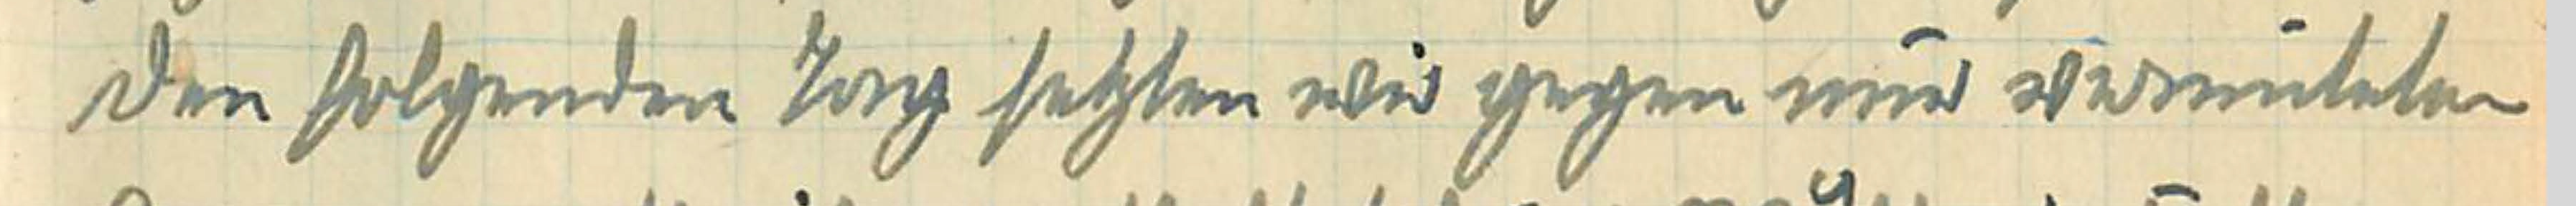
Den folgenden Tag setzten wir gegen nur vermuteten
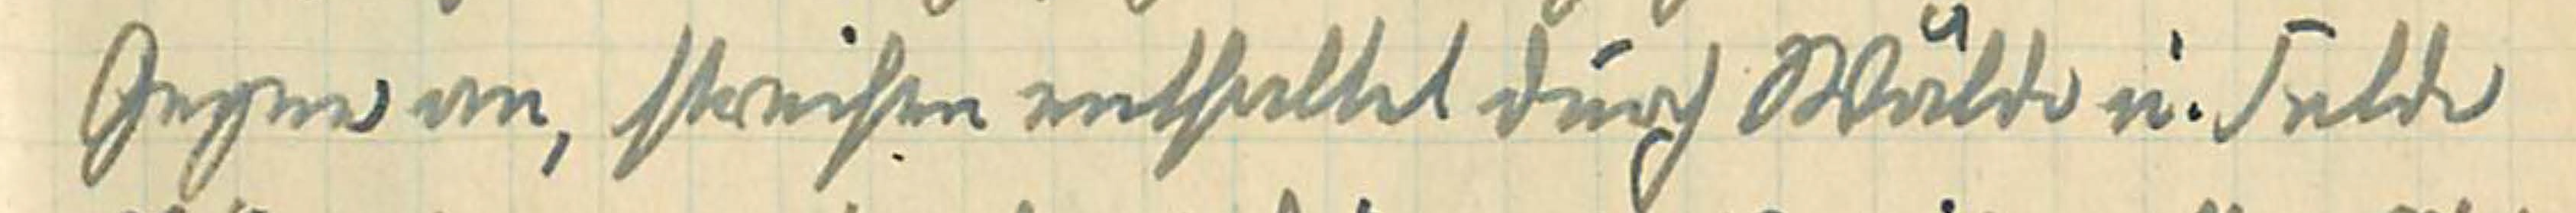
Gegner an, streifen entfaltet durch Wälder u. Felder
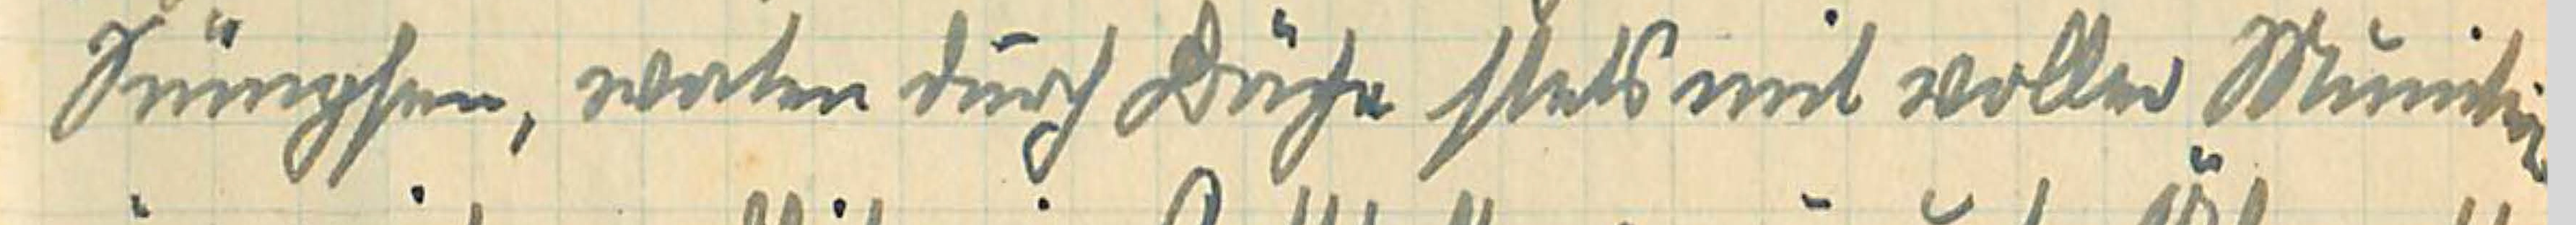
Sümpfen, waten durch Bäche stets mit voller Munition
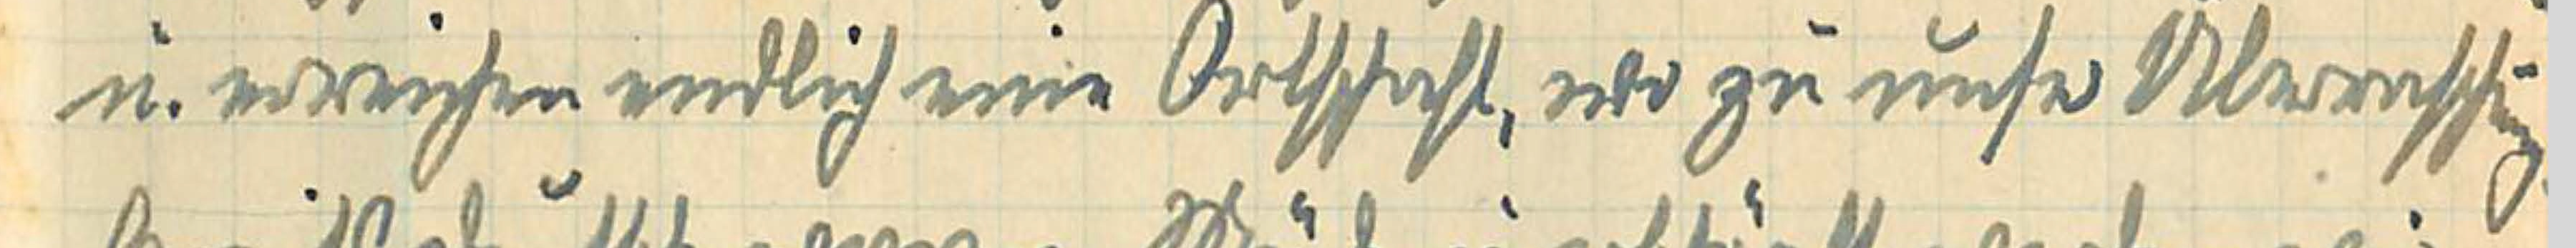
u. erreichen endlich eine Ortschaft, wo zu unser Überraschung
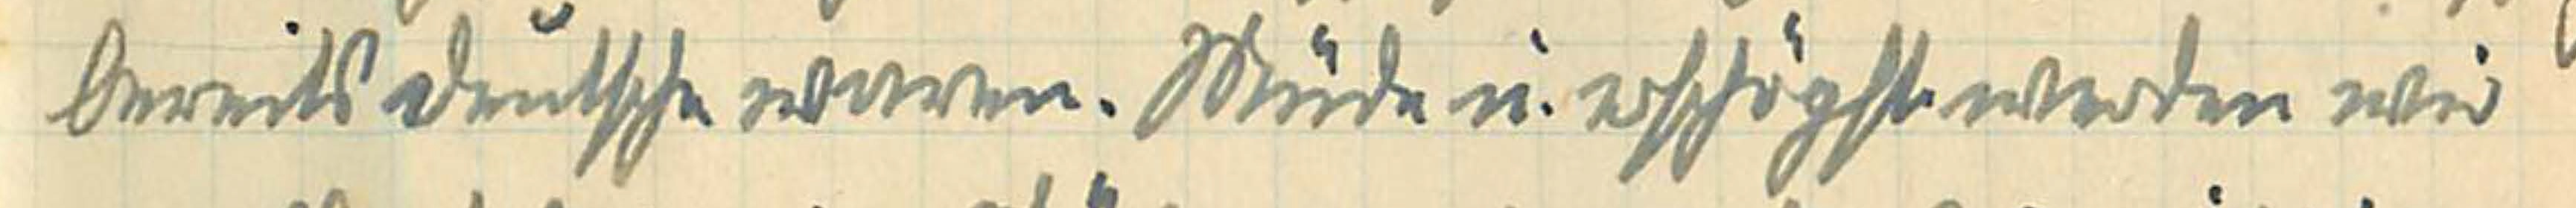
bereits Deutsche waren. Müde u. erschöpft werden wir
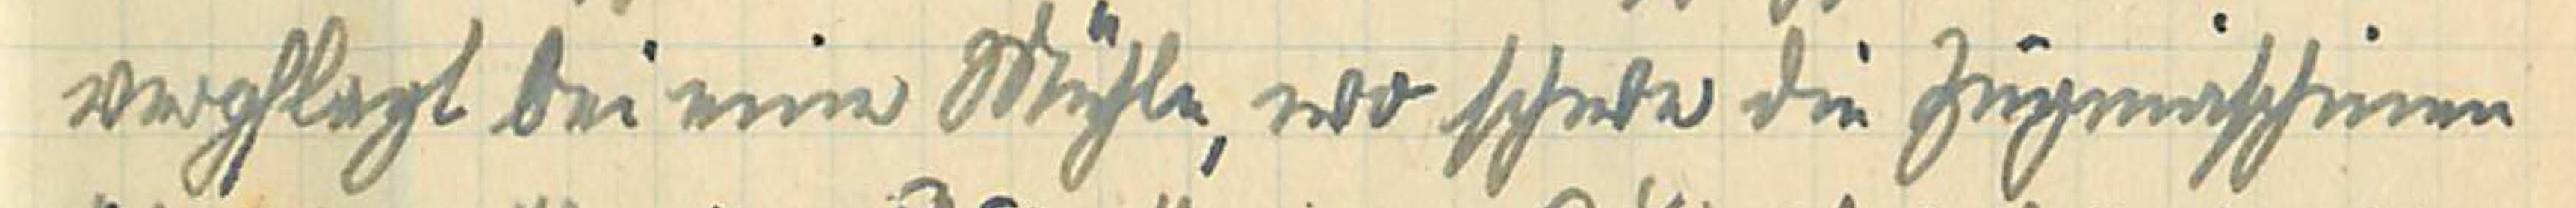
verpflegt bei einer Mühle, wo schwer die Zugmaschinen
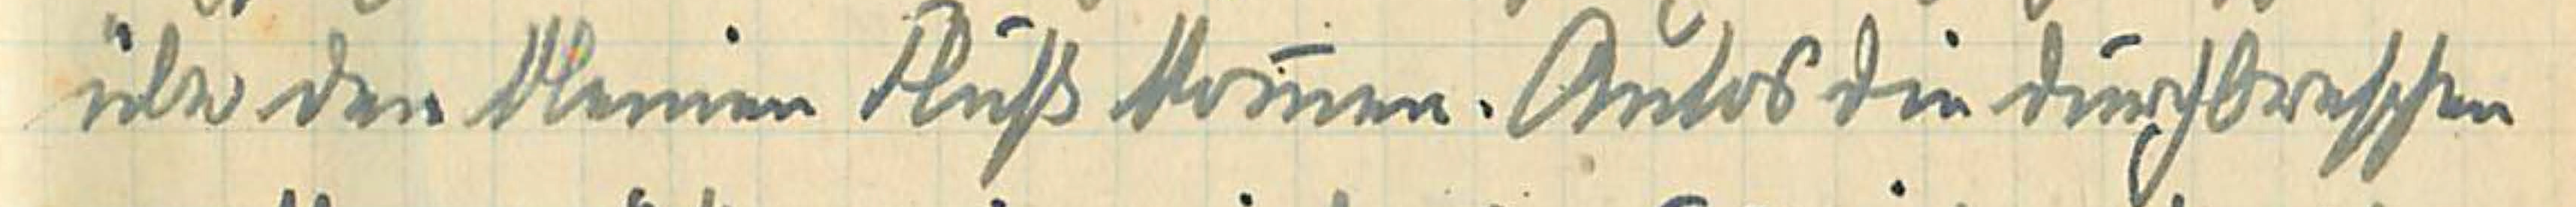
über den kleinen Fluß kommen. Autos die durchbreschen
